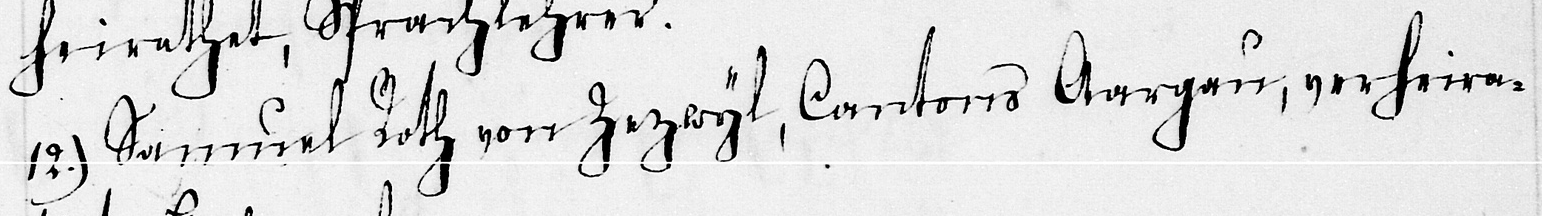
12.) Samuel Roth von Zezwyl, Cantons Aargau, verheira¬
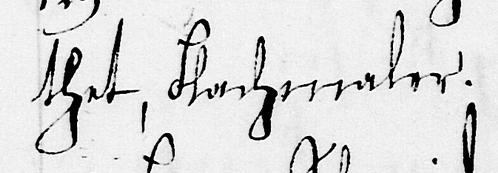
thet, Flachmaler.
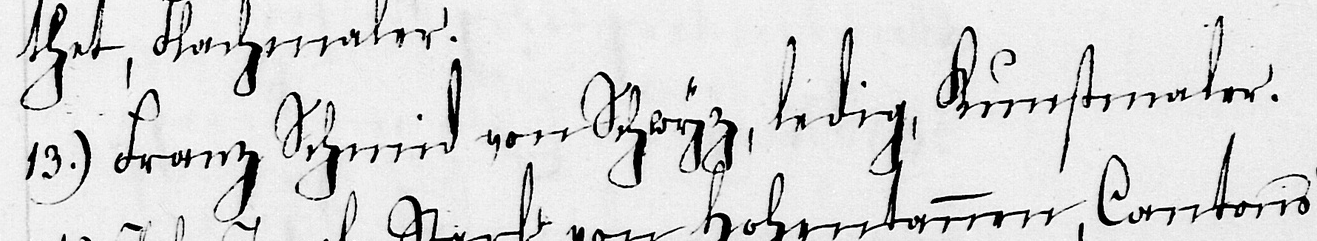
13.) Franz Schmid von Schwyz, ledig, Kunstmaler.
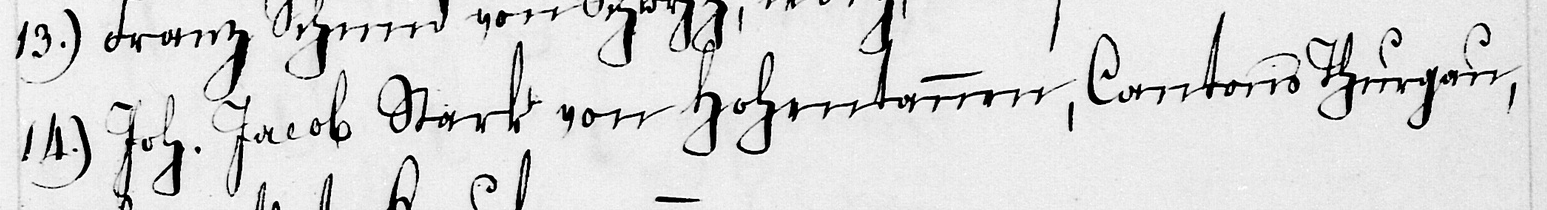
14.) Joh. Jacob Stark von Hohentannen, Cantons Thurgau,
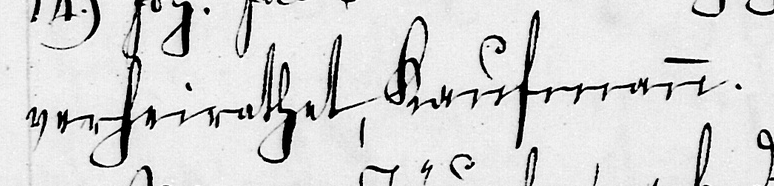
verheirathet, Kaufmann.
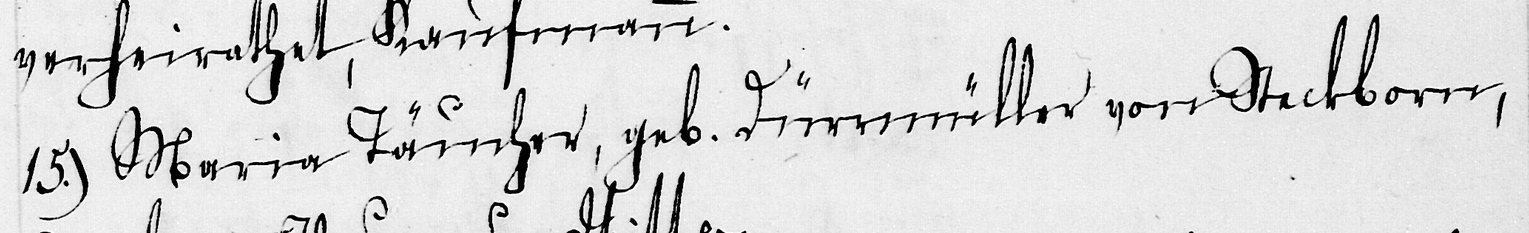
15.) Maria Täucher, geb. Dürrmüller von Steckborn,
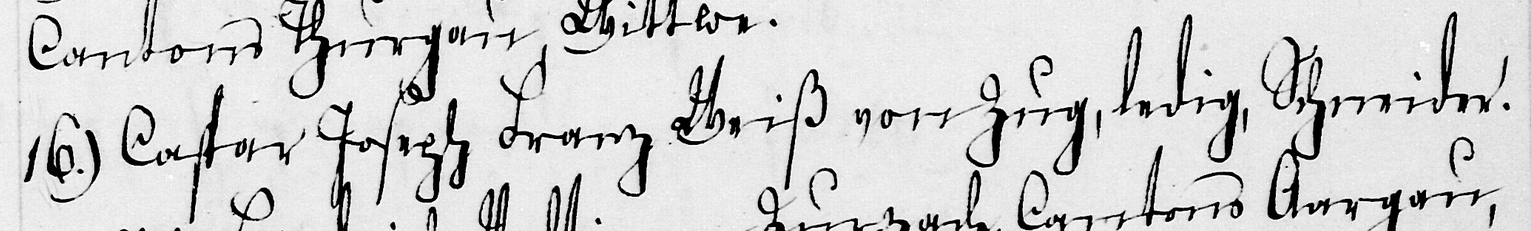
16.) Caspar Joseph Franz Weiß von Zug, ledig, Schneider.
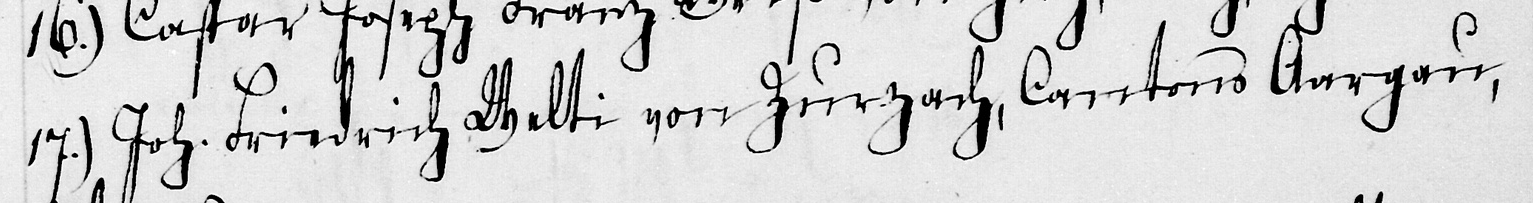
17.) Joh. Friedrich Welti von Zurzach, Cantons Aargau,
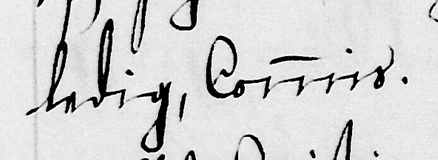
ledig, Commis.
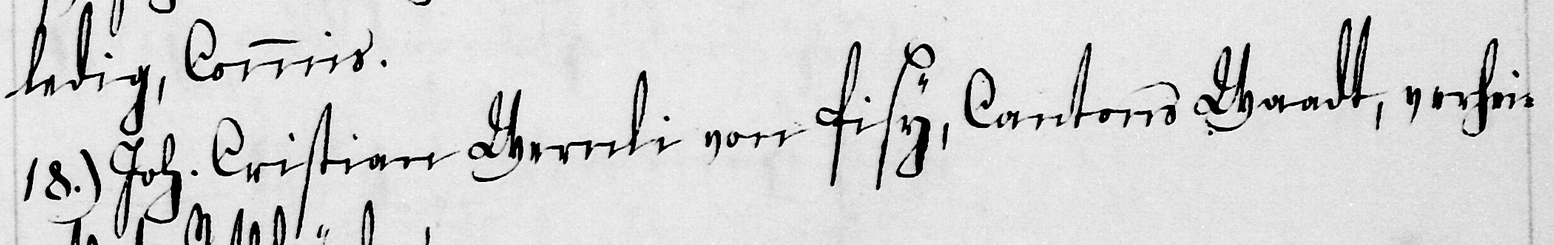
18.) Joh. Cristian Wernli von Pisy, Cantons Waadt, verhei¬
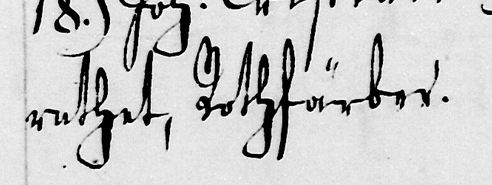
rathet, Rothfärber.
